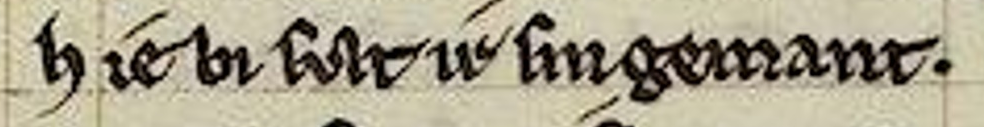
Hie bi ſvlt ir ſin gemant.
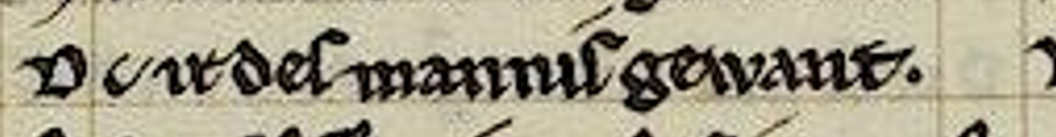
D(az) ir deſ manniſ gewant.
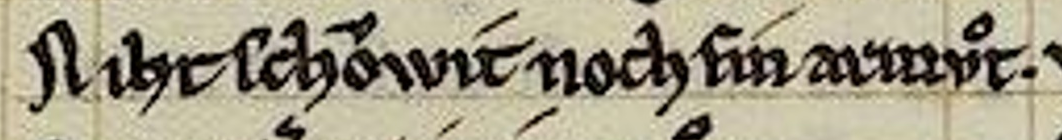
Niht ſcho°vwit noch ſin armv°ot.
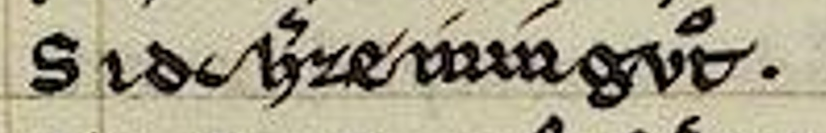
Si d(az) h(er)ze inin gv°ot.
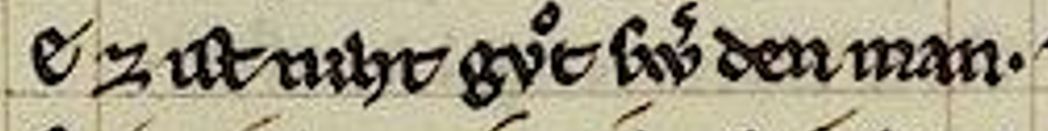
Ez iſt niht gv°ot ſw(er) den man.
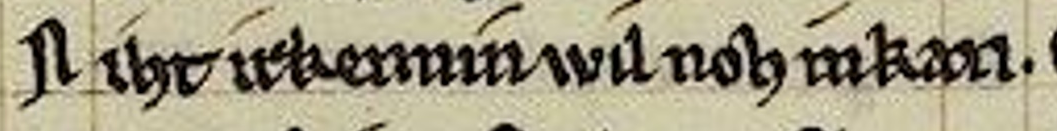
Niht irkennin wil noh inkan.
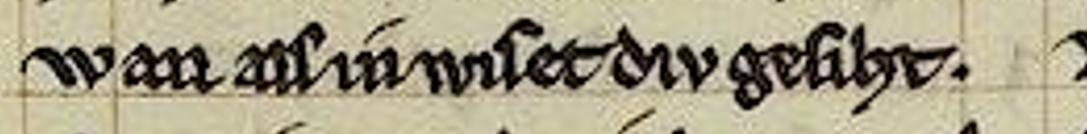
Wan alſ in wiſet div geſiht.
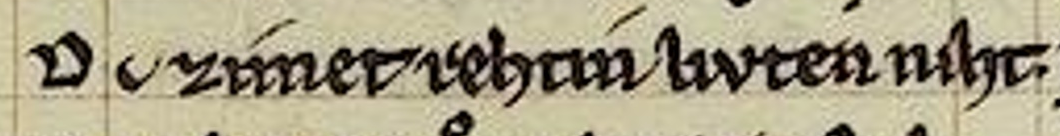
D(az) zimet rehtin livten niht.
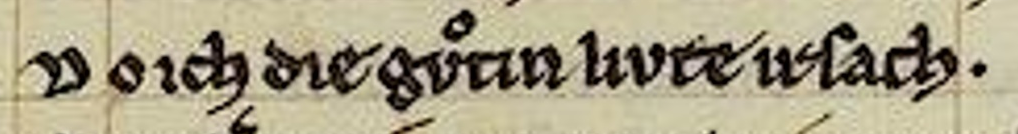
Do ich die gv°otin livte irſach.
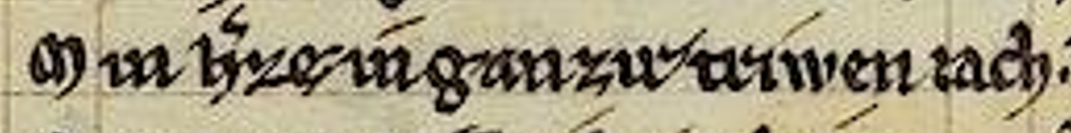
Min h(er)ze in ganzir triwen iach.
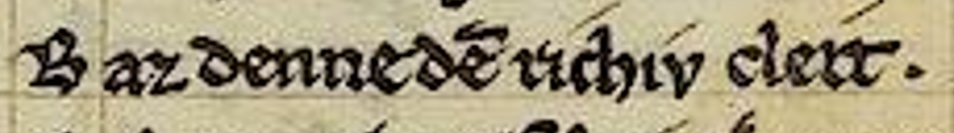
Baz denne de(n) richiv cleit.
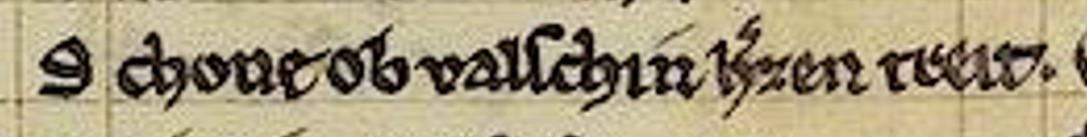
Schone ob valſchin h(er)zen treit.
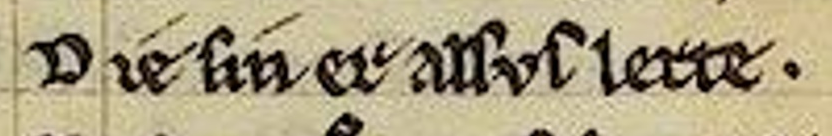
Die ſin er alſvſ lerte.
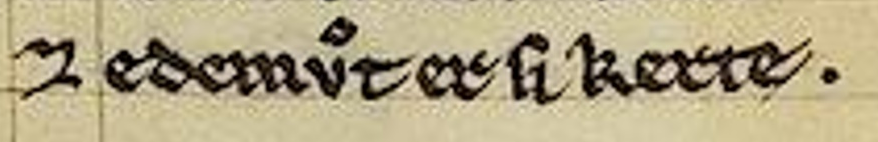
Zedemv°ot er ſi kerte.
